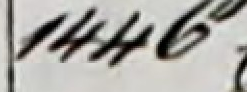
1446
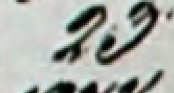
23
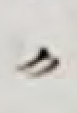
„
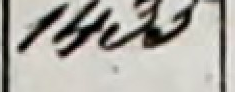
1435
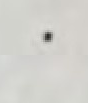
„
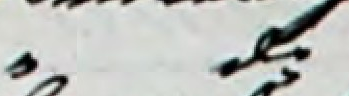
„ do
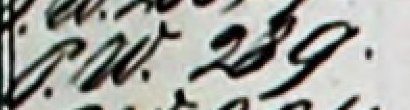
P.W. 289...
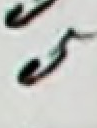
5
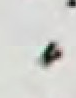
„
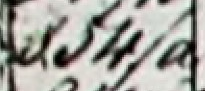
854/a
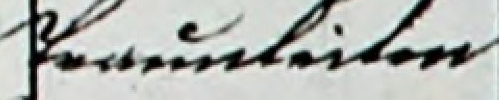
Traunleiten
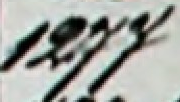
1277
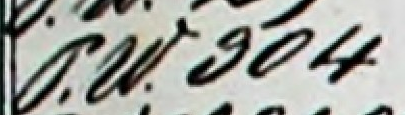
P. W. 304
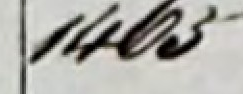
1465
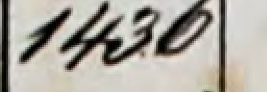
1436
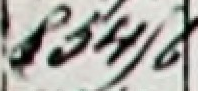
854/b
